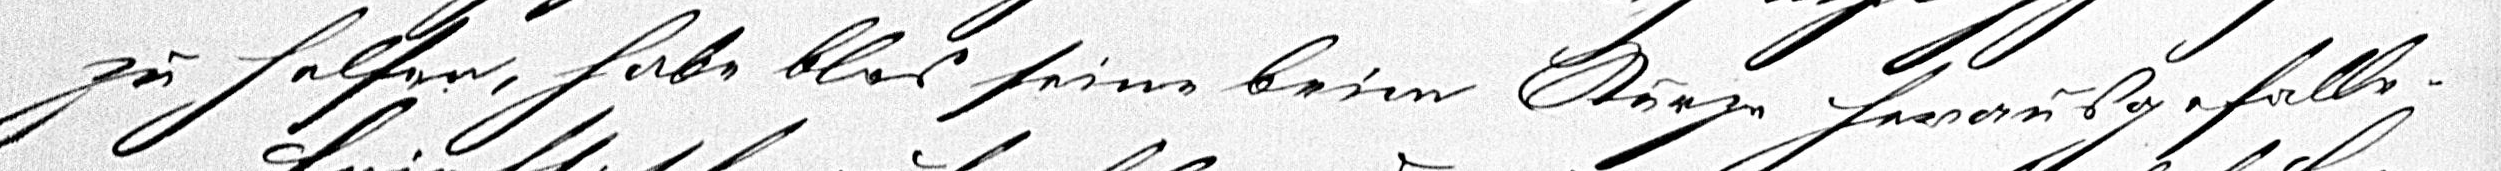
zu helfen, habe blos seine beim Sturze herausgefalle¬
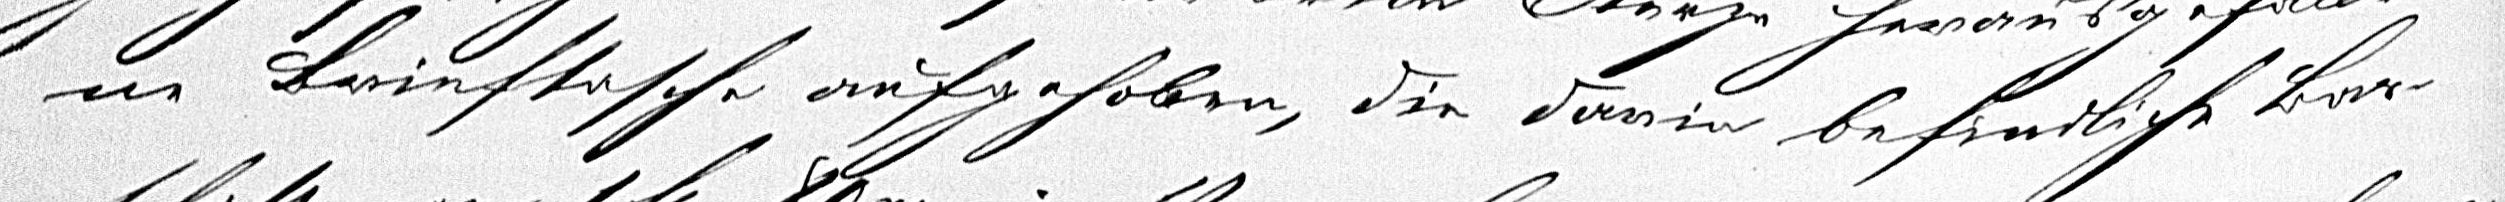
ne Brieftasche aufgehoben, die darin befindliche Bar¬
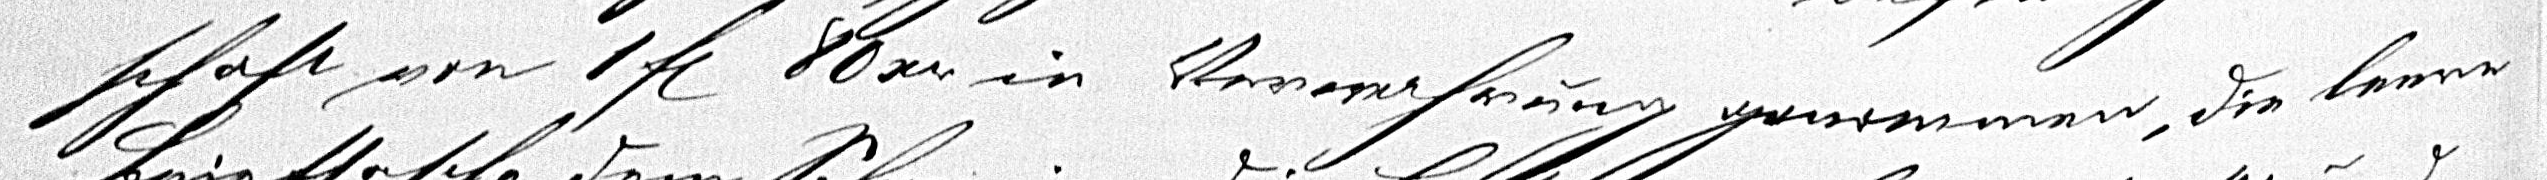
schaft von 1 fl 80 er in Verwahrung genommen, die leere
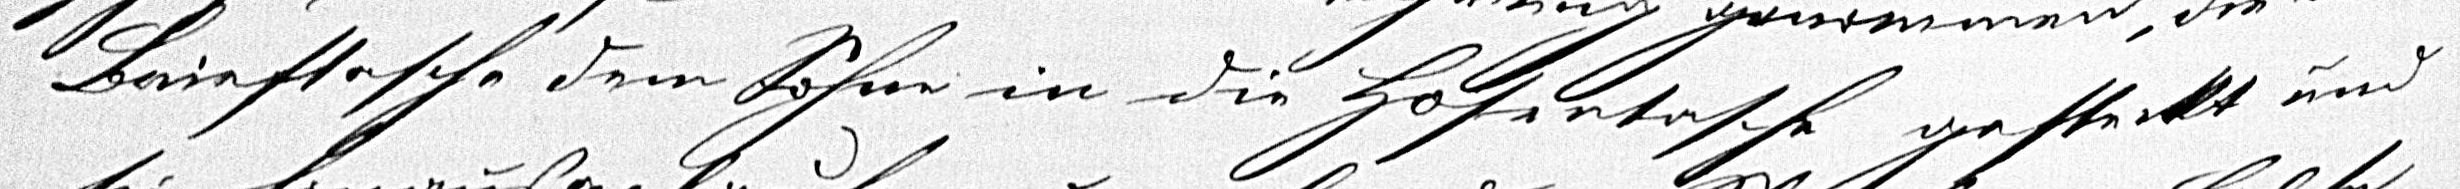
Bxxche dem Sohne in die Hosentasche gesteckt und
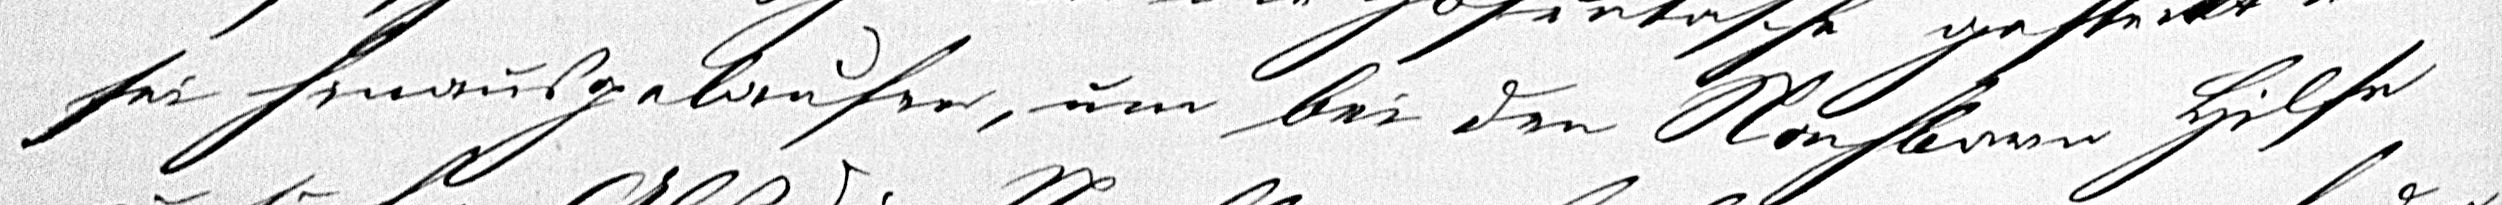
sei Hinausgelaufen, um bei den Nachbarn Hilfe
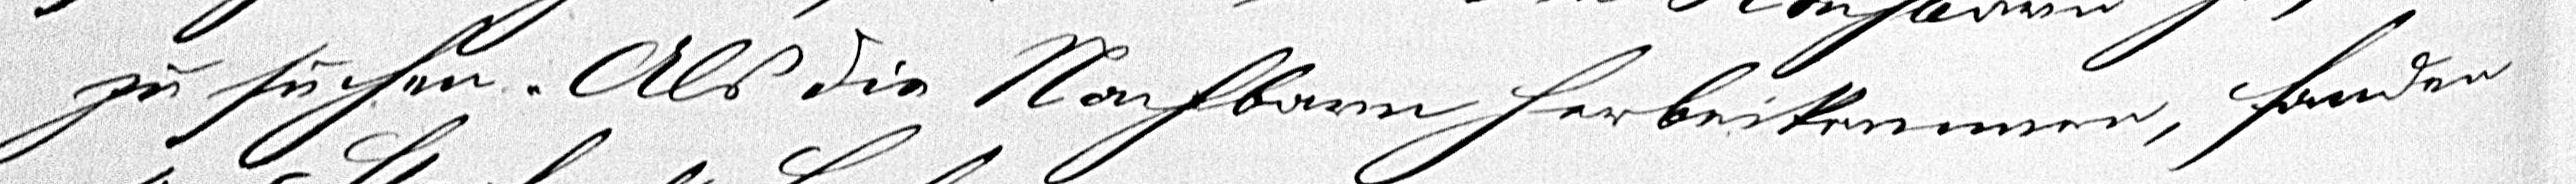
zu suchen. Als die Nachbarn herbeikommen, fanden
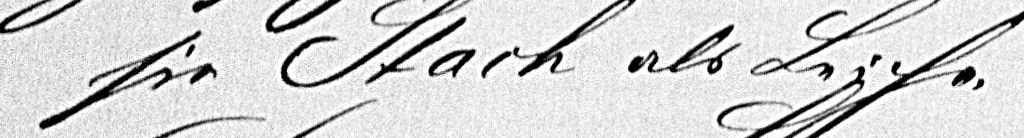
sie Stach als Leiche.
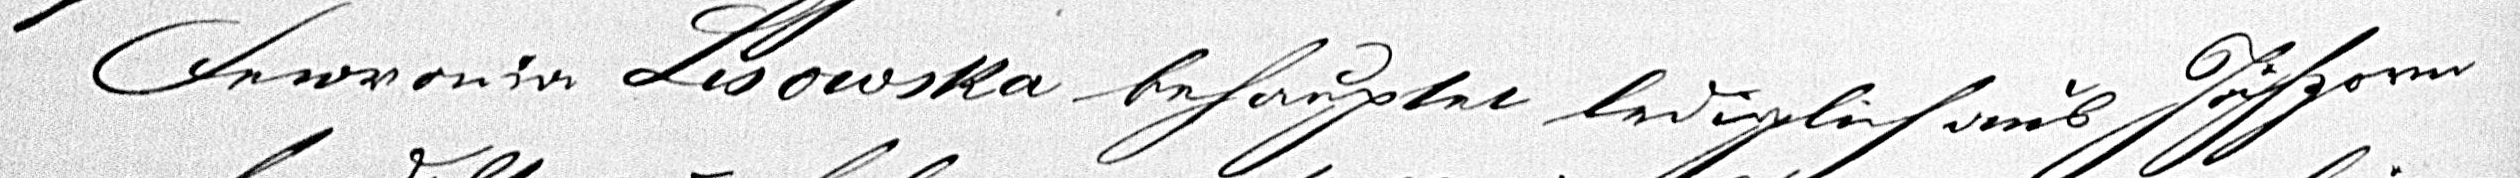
xx Lisowska behauptet lediglich aus Jähzorn
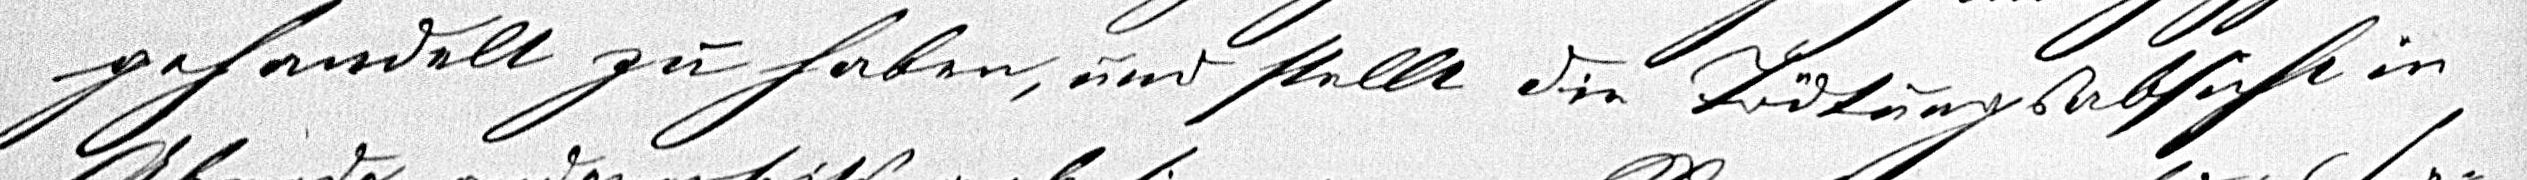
gehandelt zu haben, und stellt die Tödtungsabsicht in
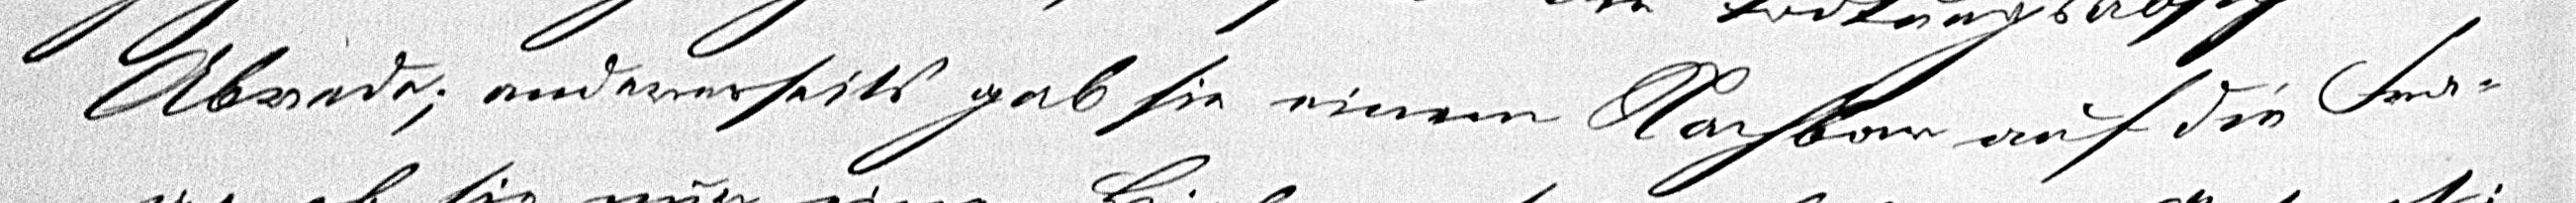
Abrede; andererseits gab sie einem Nachbar auf die Fra¬
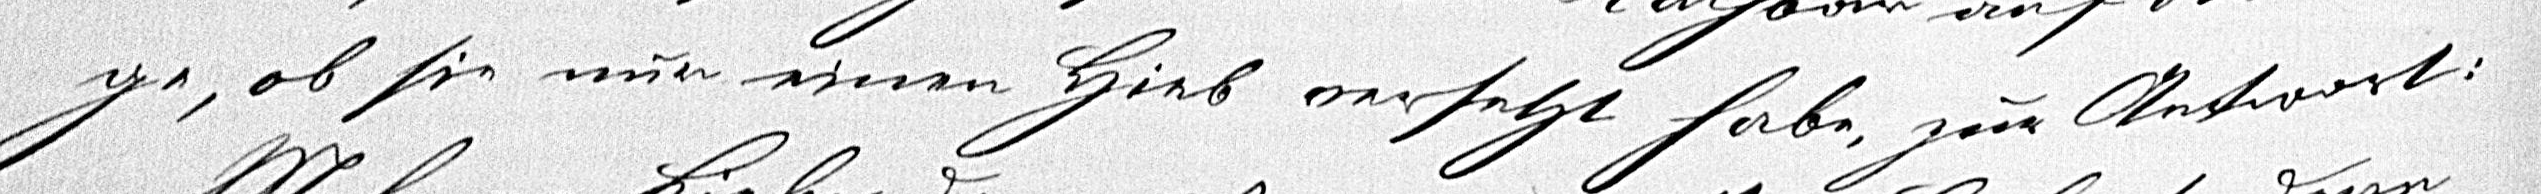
ge, ob sie nur einen Hieb versetzt habe, zur Antwort:
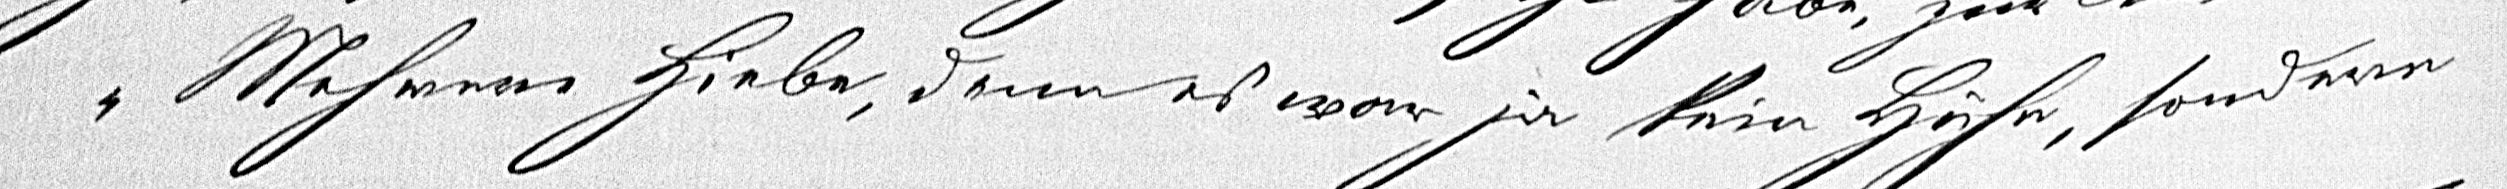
„Mehrere Hiebe, denn es war ja kein Höhe, sondern
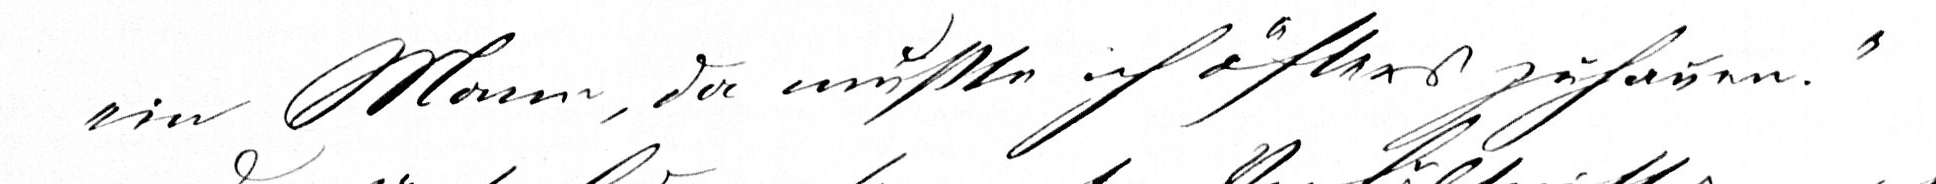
ein Mann, da mußte ich öfters zuhauen."
